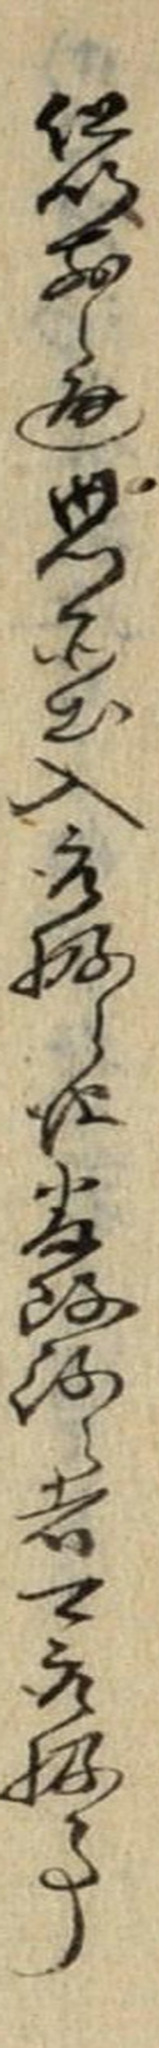但以前之通御門所出入取扱之儀番改役之者可取扱事
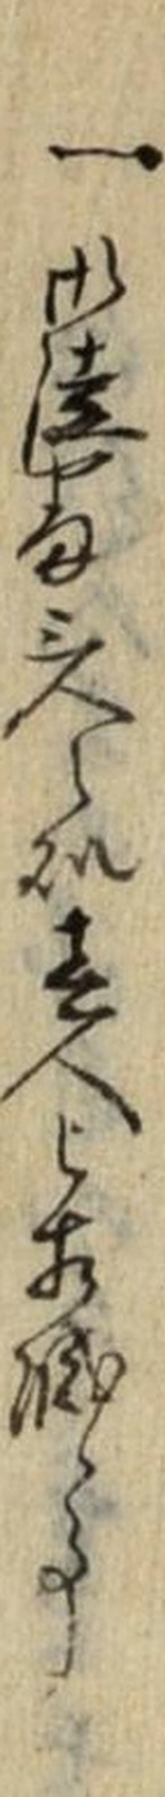一御徒番三人之処壱人被相減候事
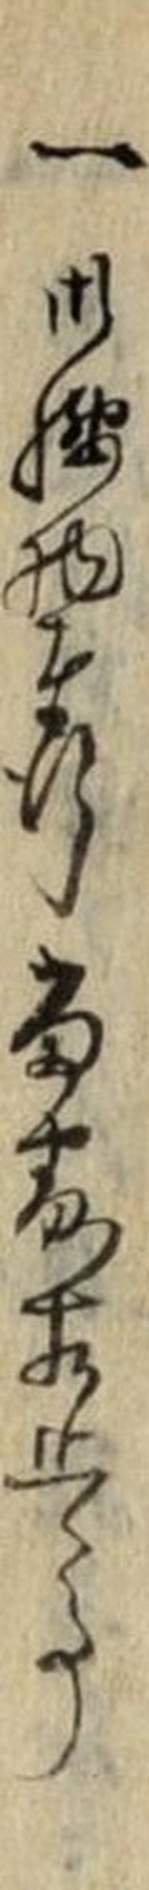一御腰物奉行当番相止候事
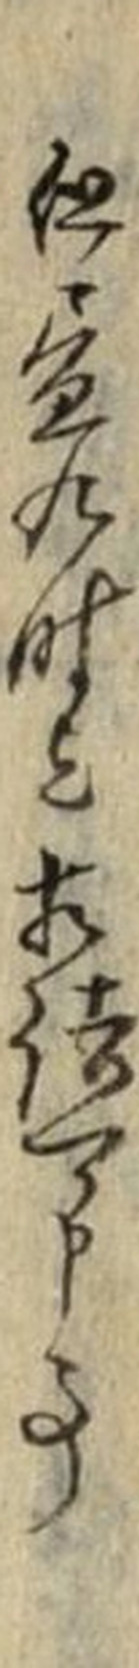但昼九時迄相詰可申事
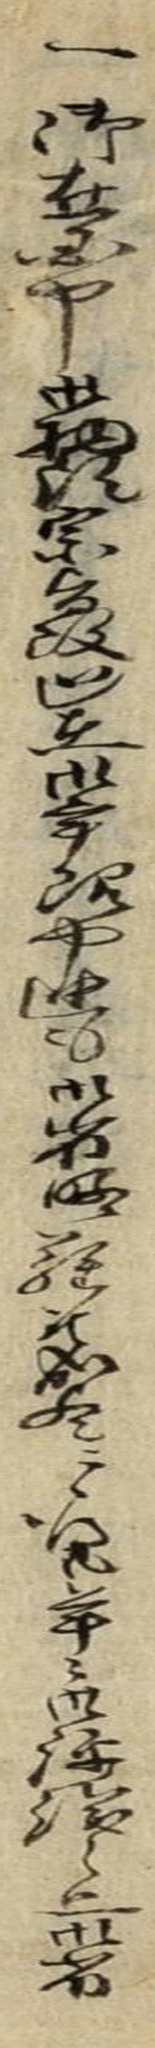一御在国中御物頭宗旨改廻在御年限中迚も御省略難被成歟に候得共年々御評議之上御省
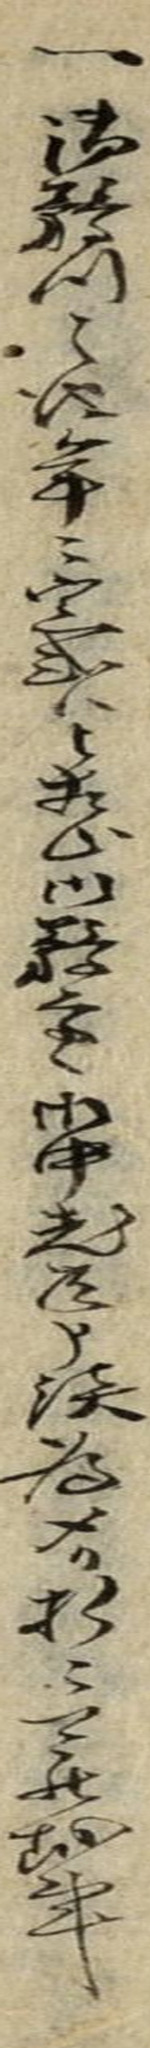一御鵜川之儀年々定式は被相止御鵜方へ御中老共申談為相〆り折々可罷越事
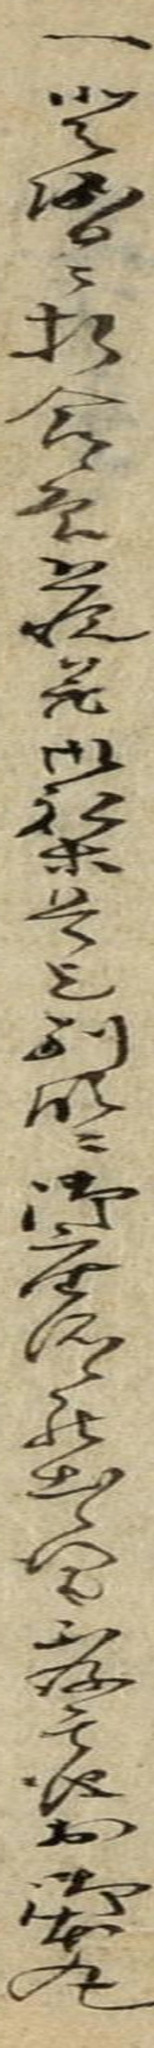一登城日に折合候節恐悦并御礼等是迄別段に御座所へ罷出候得共不及其儀於御本丸
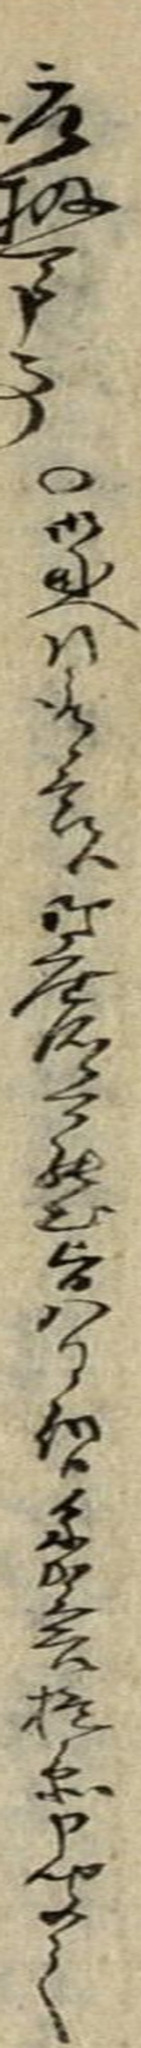取扱可申事○御用人引取候節は御座所へ可罷出旨八月朔日多賀谷権兵衛申聞之
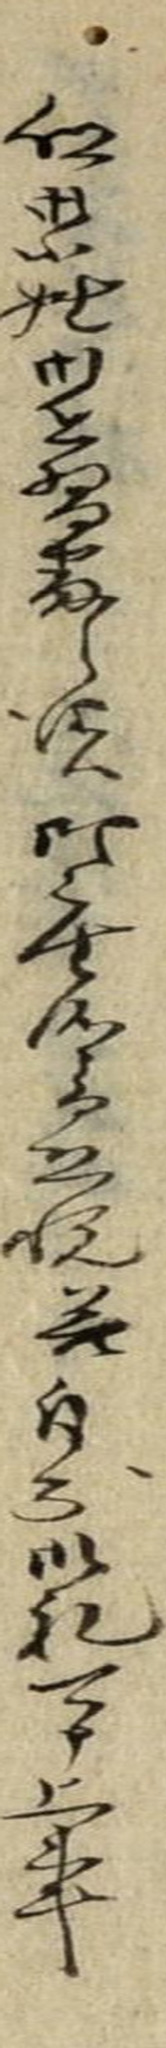但御小姓御近習番之儀は御座所に而恐悦并自分御礼可申上事
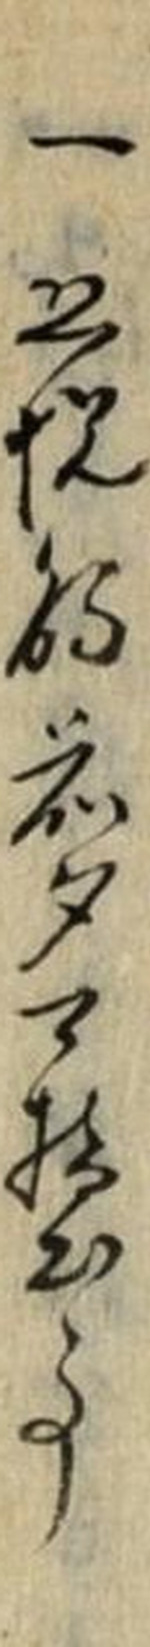一恐悦触前夕可指出事
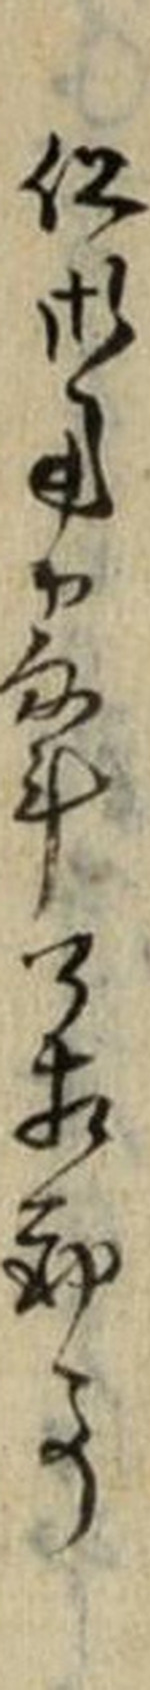但御用番斗可相勤事
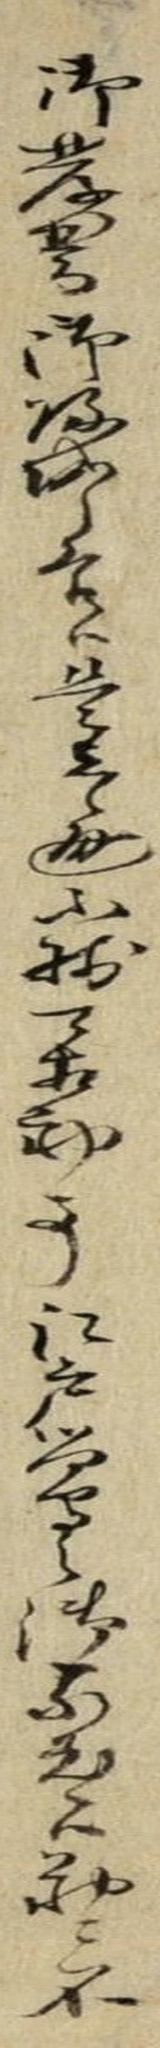御発駕御帰城之節は是迄之通不残可相勤事江戸留守之御家老へは勤に不及事
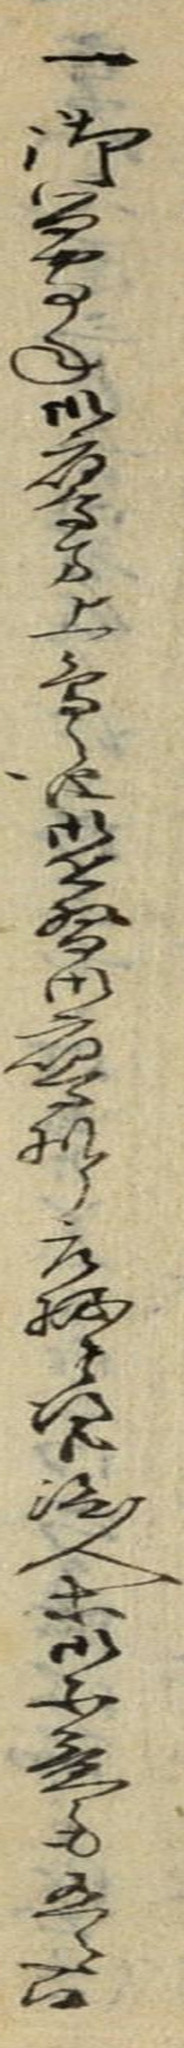一御留守年御鷹方上鳥之儀近習御鷹掛り取扱候得共渡人等御不益候も有之候間
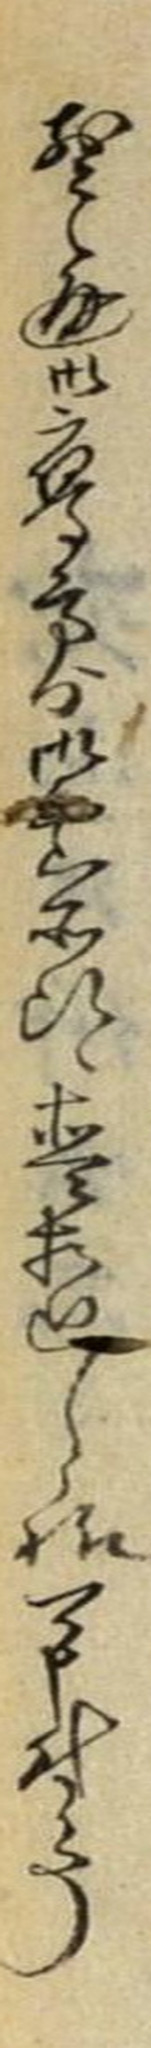前々通御鷹方ゟ御番所頭へ直々相廻し候様可申付事
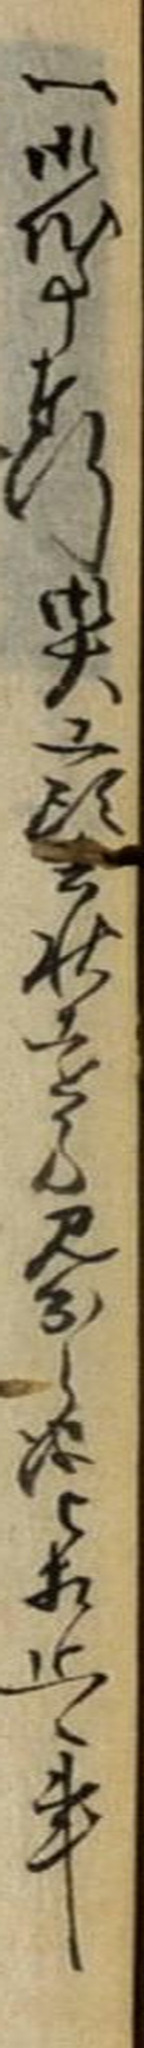一御作事奉行御大工頭書状不とくしん？見分之儀被相止候事
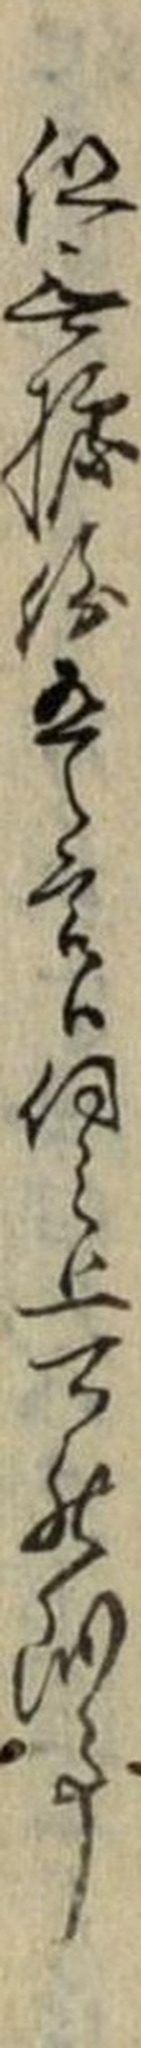但無拠儀有之候節は伺之上可罷掛事
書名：御用并被仰出之部
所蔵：福井県文書館 Fukui Prefectural Archives
